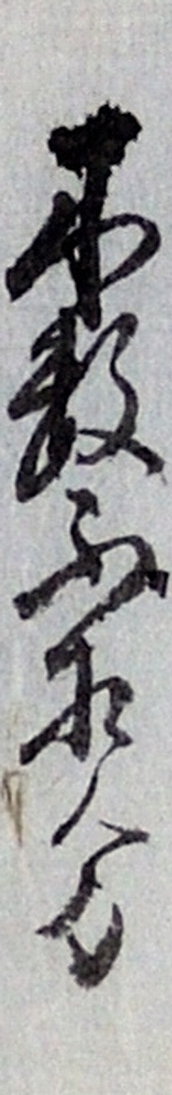木数不相分
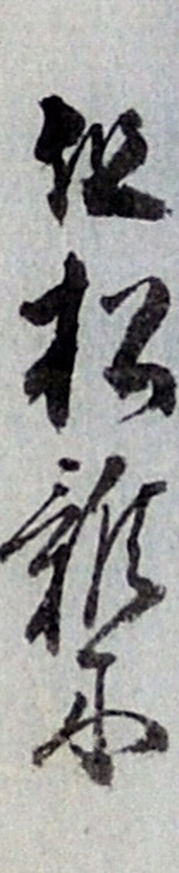但松雑木
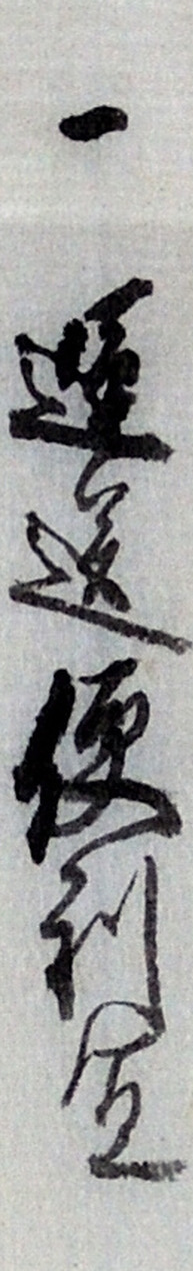一運送便利宜
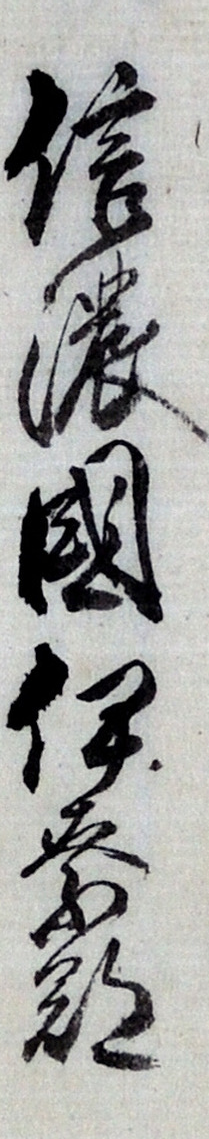信濃国伊那郡
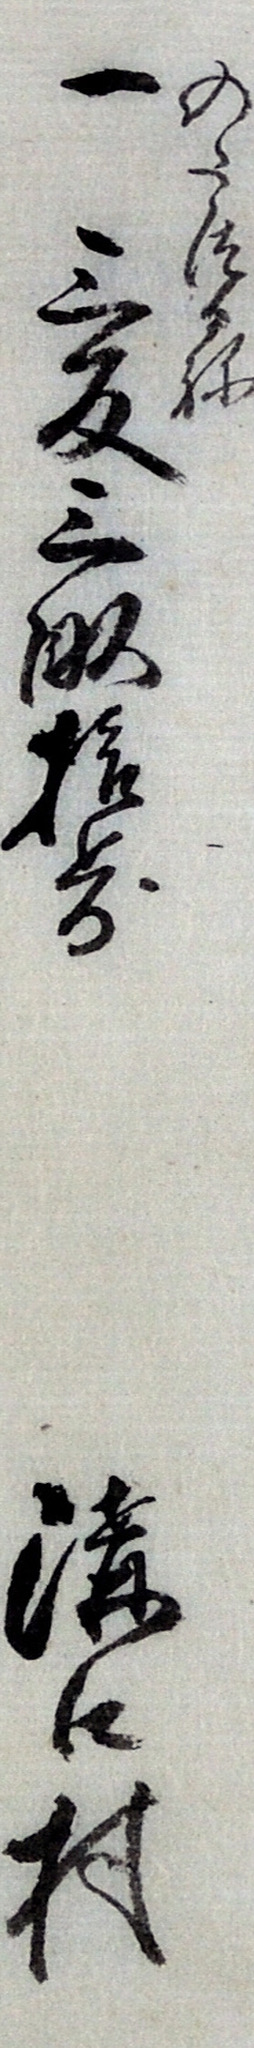一三反三㽗拾分溝口村
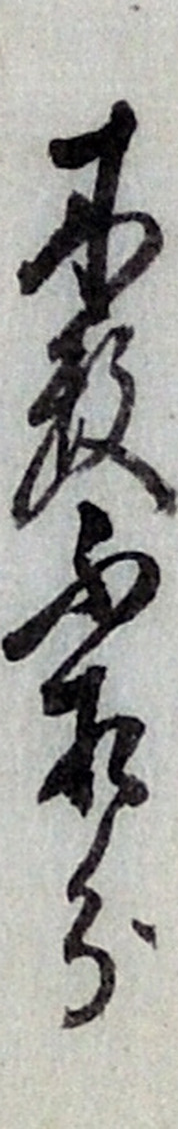木数不相分
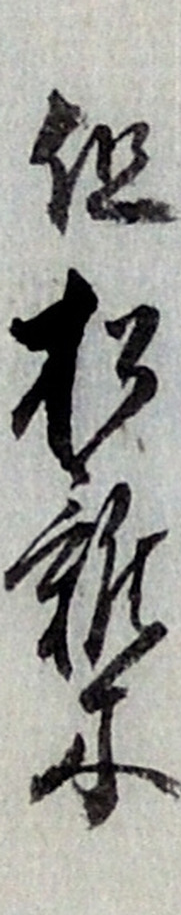但松雑木
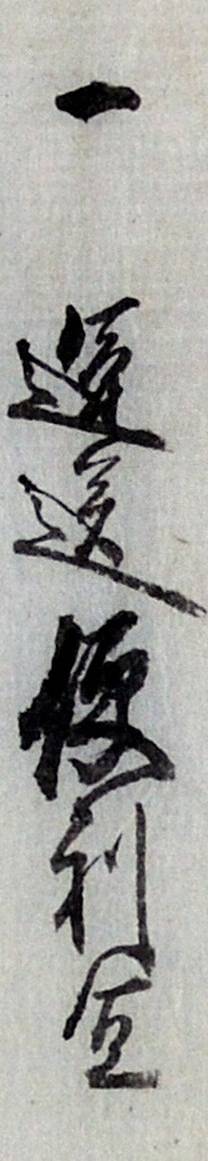一運送便利宜
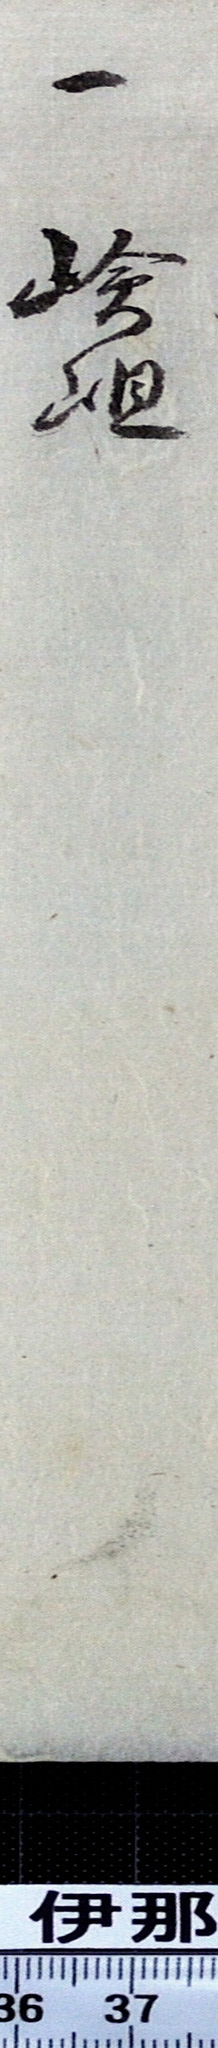一嶮岨
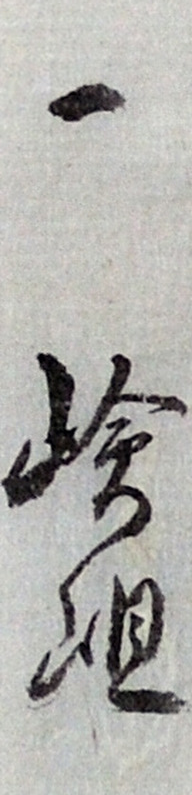一嶮岨

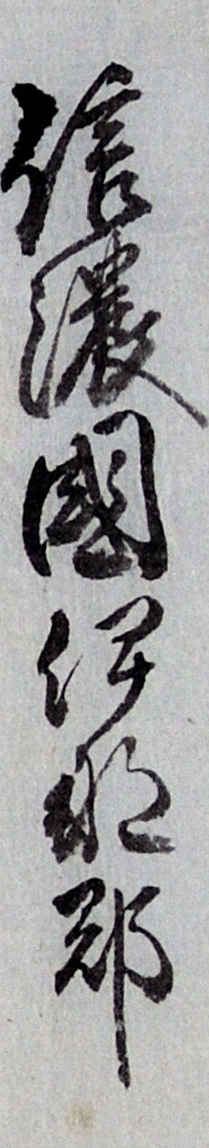信濃国伊那郡
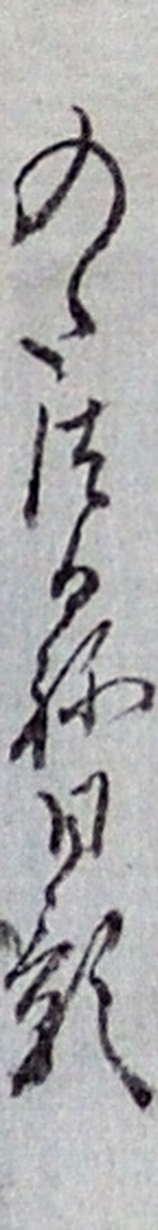のたつるね日影
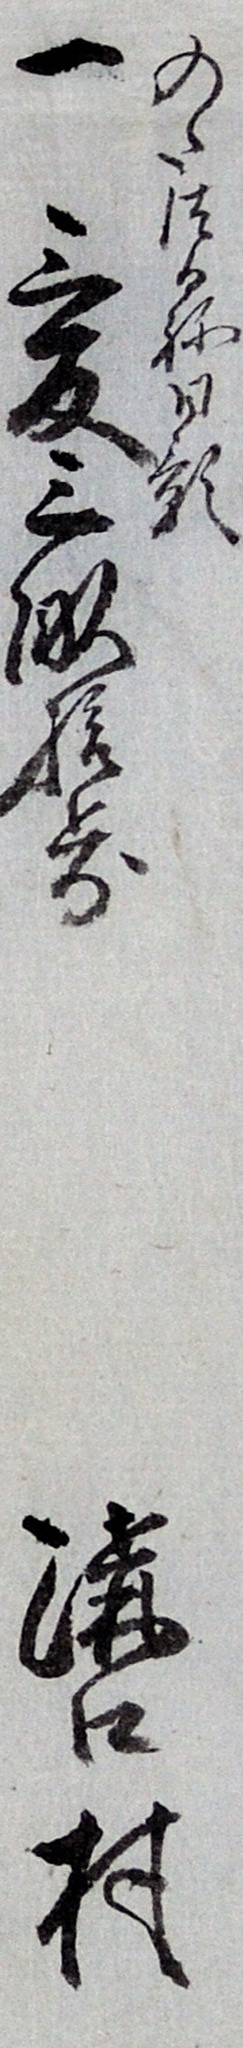一三反三㽗拾歩溝口村
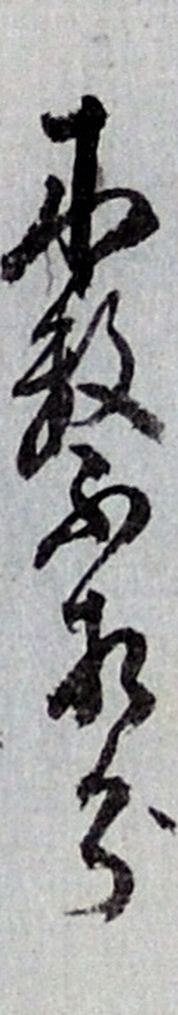木数不相分
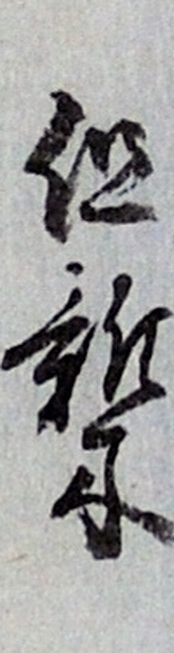但雑木
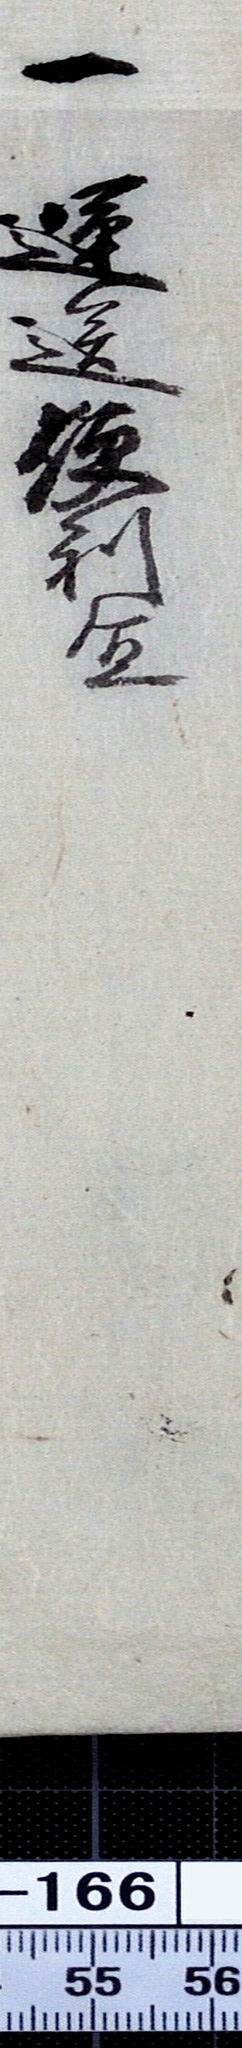一運送便利宜
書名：官林反別帳
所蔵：伊那市立高遠町図書館・合同会社AMANE
